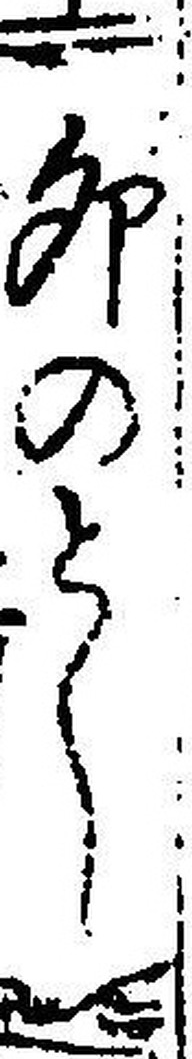卯のとし
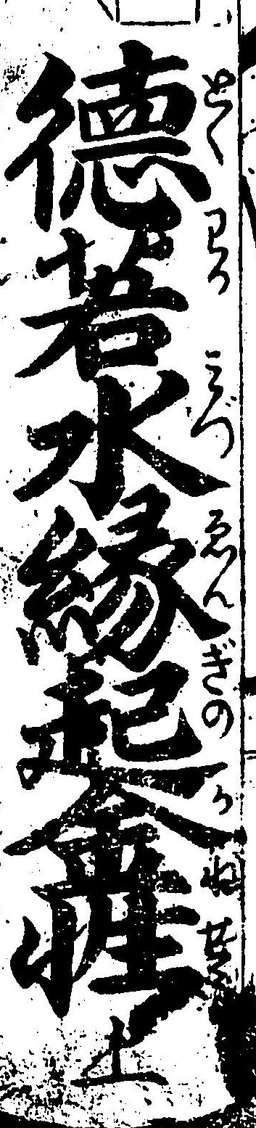徳若水縁起金性上

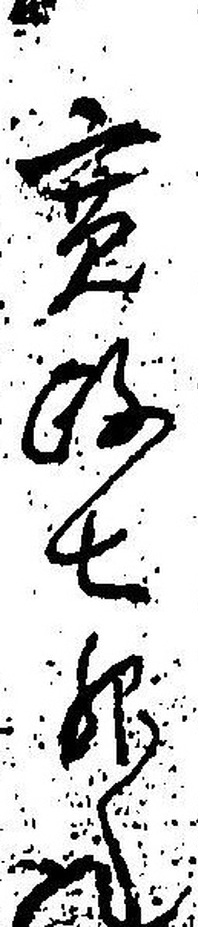寛政七卯年
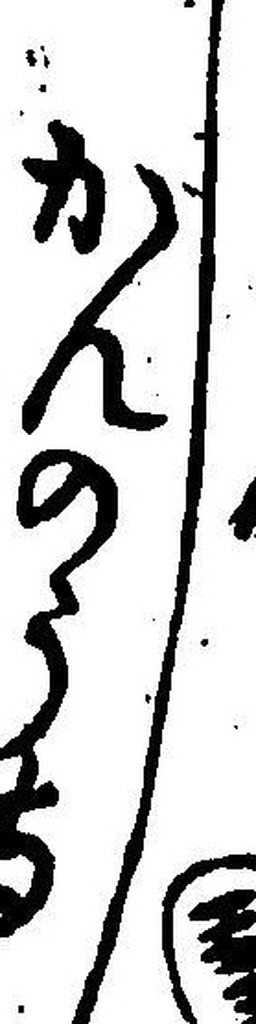かんのう寺
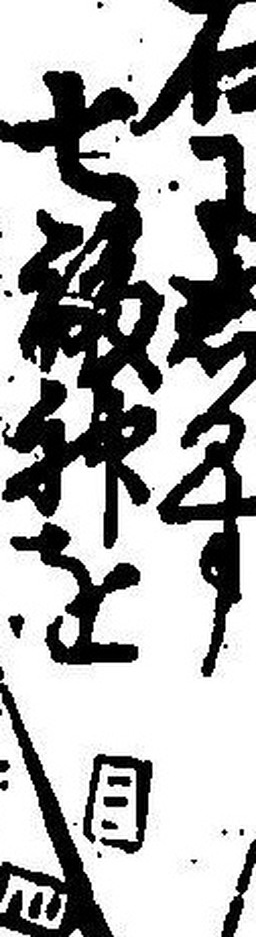七福神を
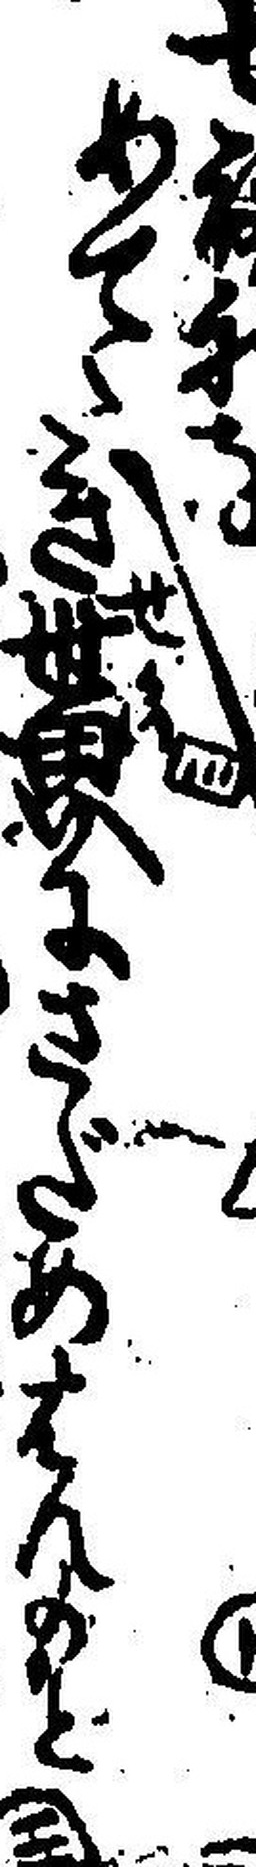めてたき世界にさだめはんもと
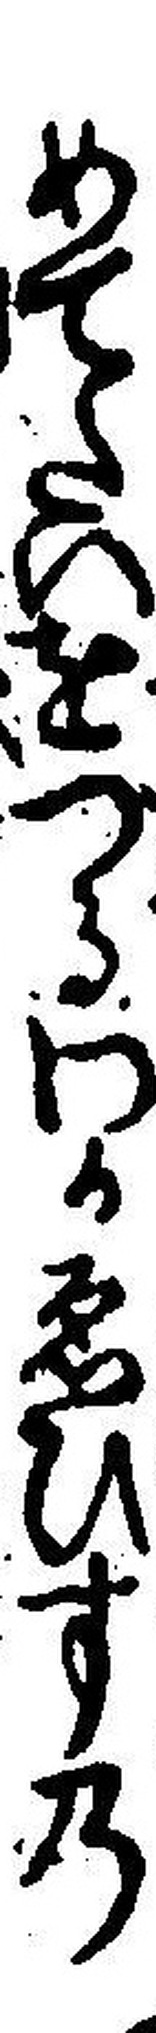めてたいをつるわかゑひすの
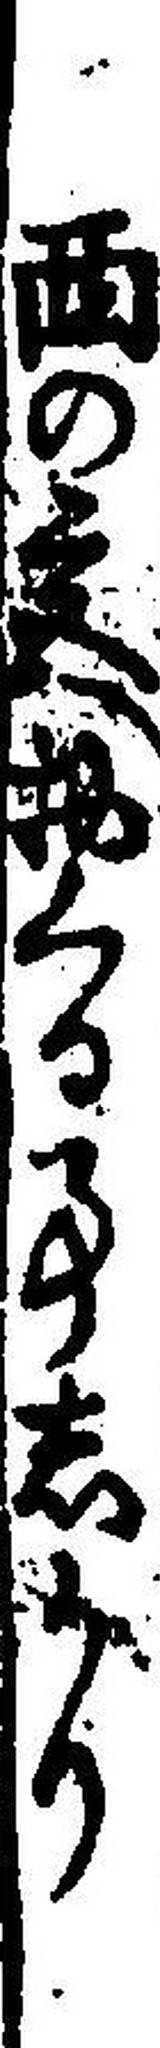西の宮へおくる事しかり

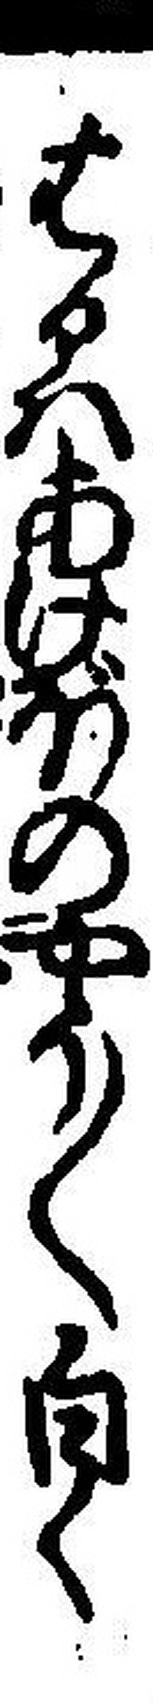はるはあけぼのやう〳〵白く
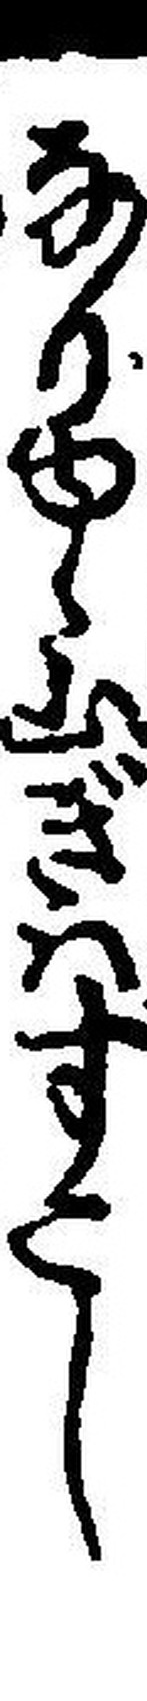なりゆく山ぎはすこし
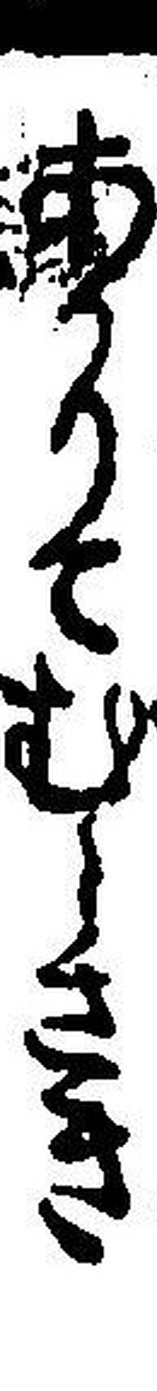あかりてむらさき
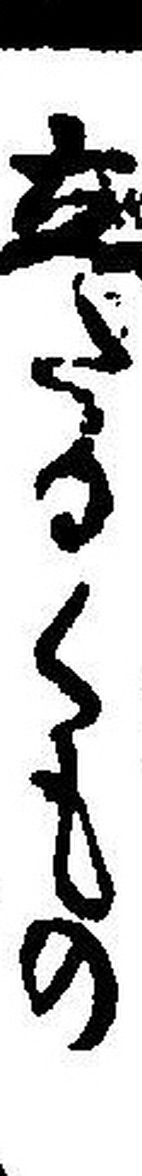立たるくもの
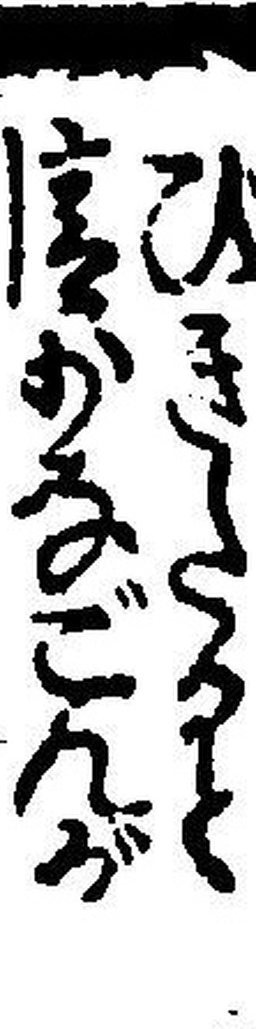清少なごんが
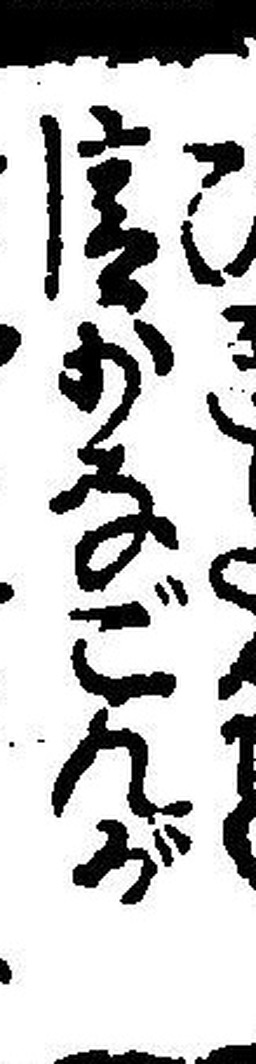清少なごんが
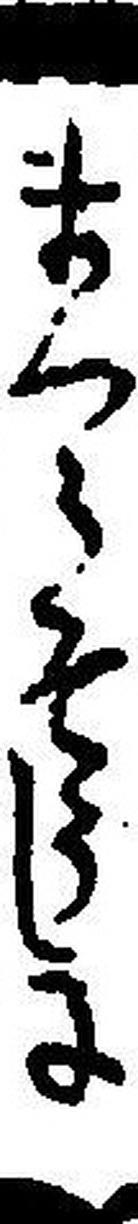まくらそうしに
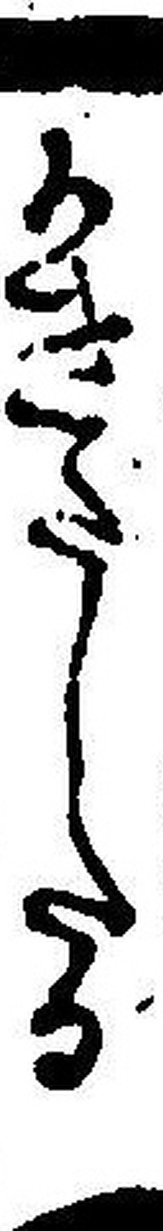かきたしたる
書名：徳若水縁起金性 / 樹下石上作
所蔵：東京大学総合図書館 General Library in the University of Tokyo, JAPAN
